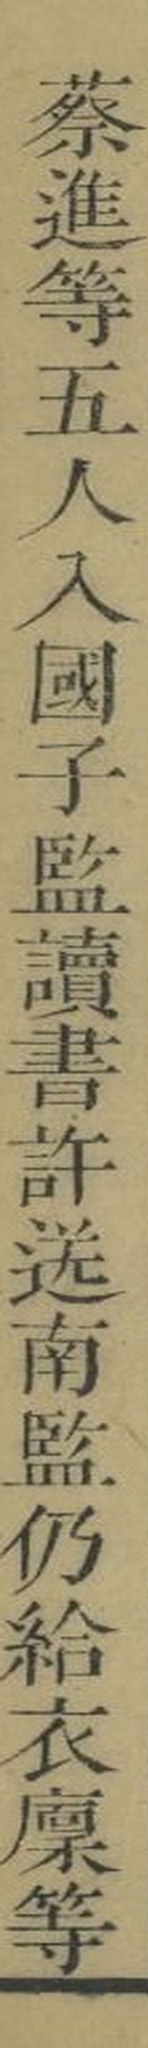蔡進等五人入国子監読書許送南監仍給衣廩等

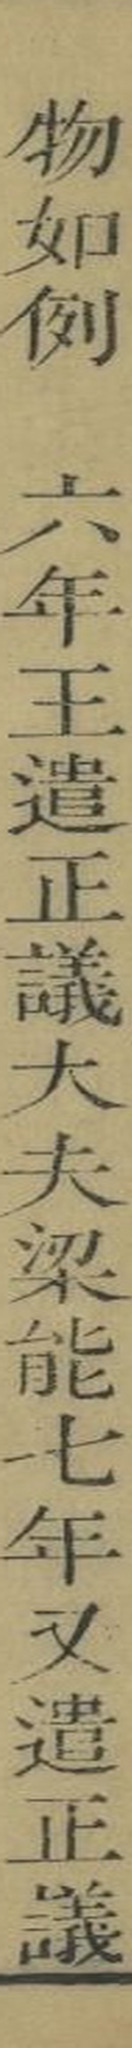物如例六年王遣正議大夫梁能七年又遣正議
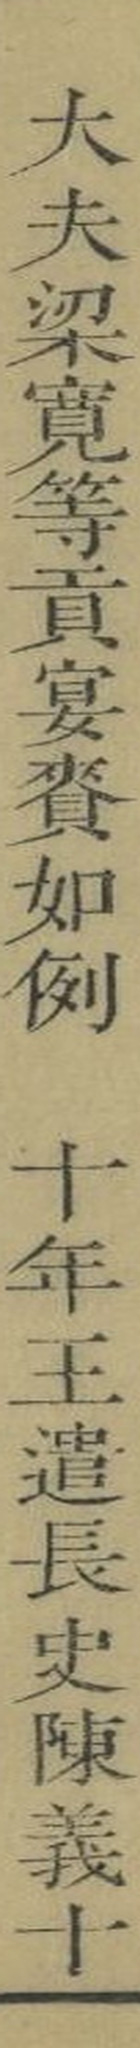大夫梁寛等貢宴賚如例十年王遣長史陳義十
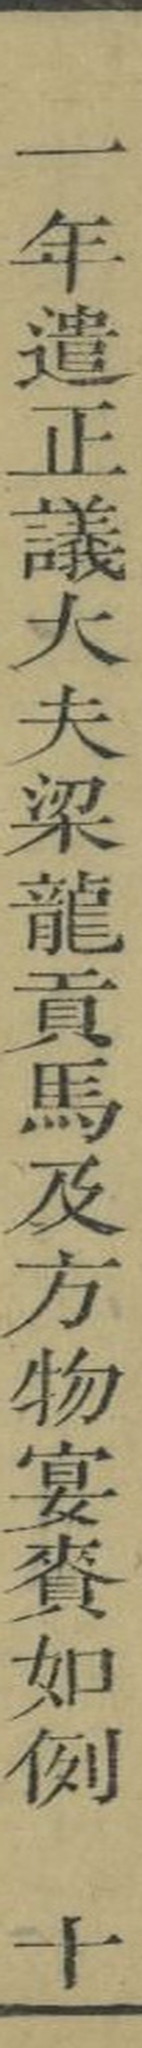一年遣正議大夫梁竜貢馬及方物宴賚如例十
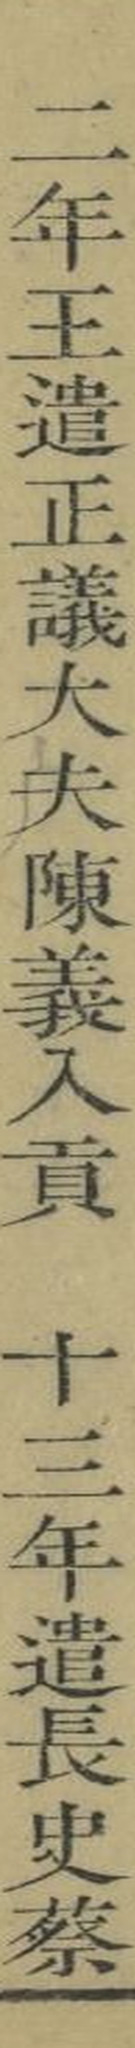二年王遣正議大夫陳義入貢十三年遣長史蔡
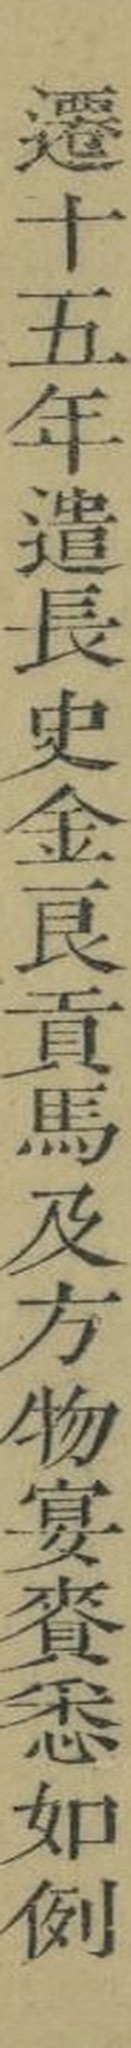遷十五年遣長史金良貢馬及方物宴賚悉如例
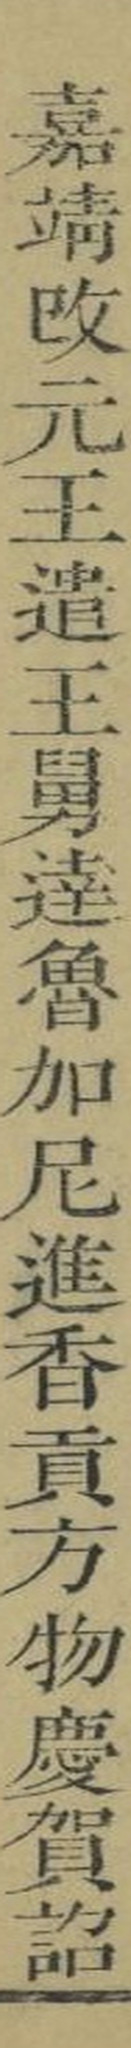嘉靖改元王遣王舅達魯加尼進香貢方物慶賀詔
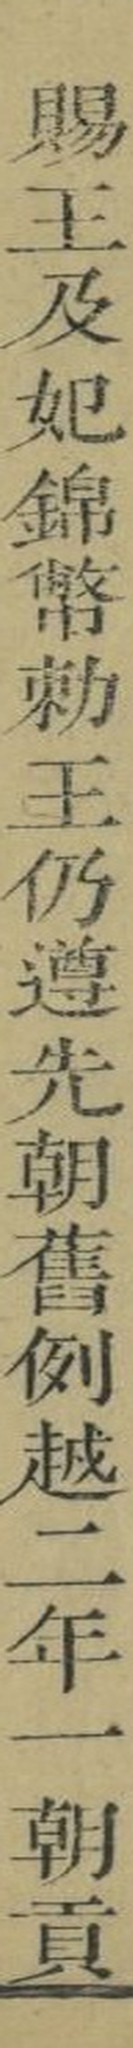賜王及妃錦幣勅王仍遵先朝旧例越二年一朝貢
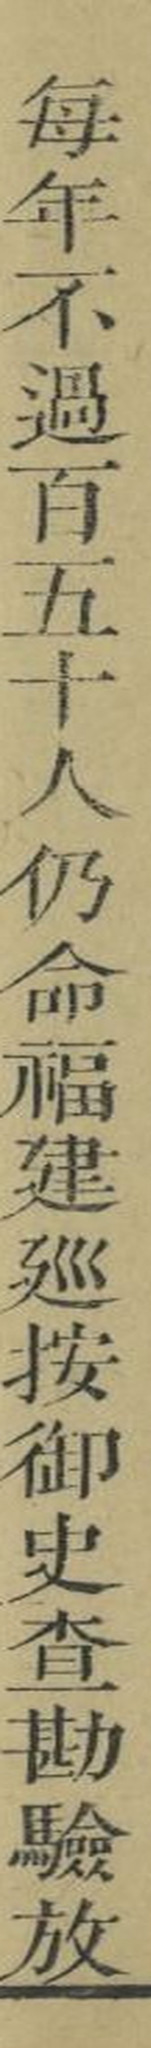毎年不過百五十人仍命福建巡按御史査勘験放
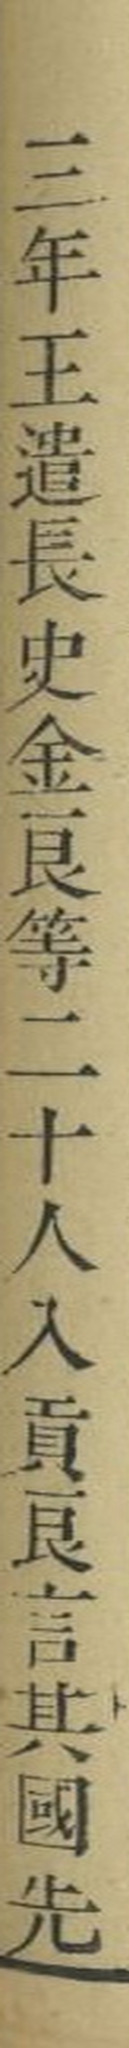三年王遣長史金良等二十人入貢良言其国先
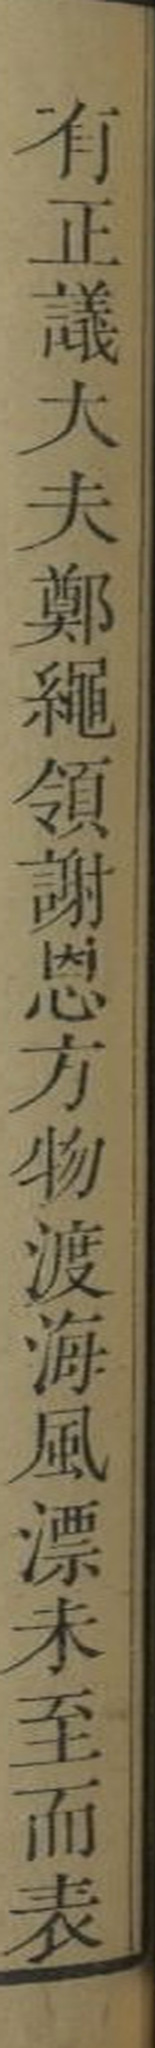有正議大夫鄭縄領謝恩方物渡海風漂未至而表
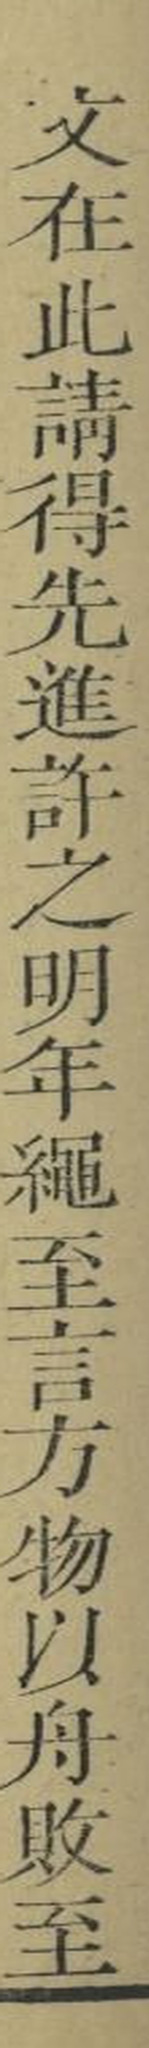文在此請得先進許之明年縄至言方物以舟敗至
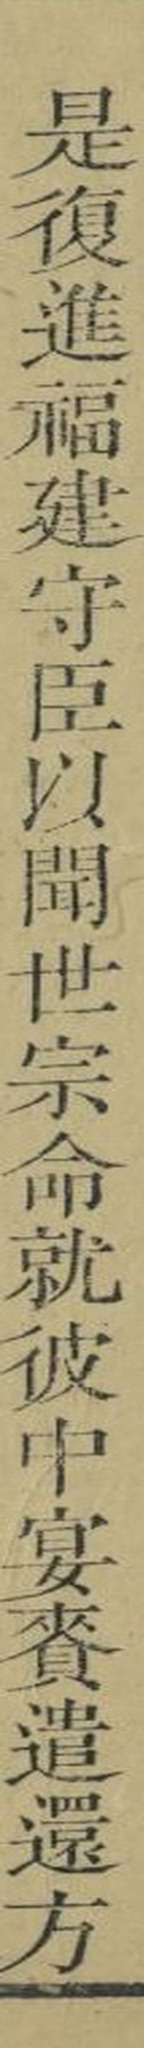是復進福建守臣以聞世宗命就彼中宴賚遣還方
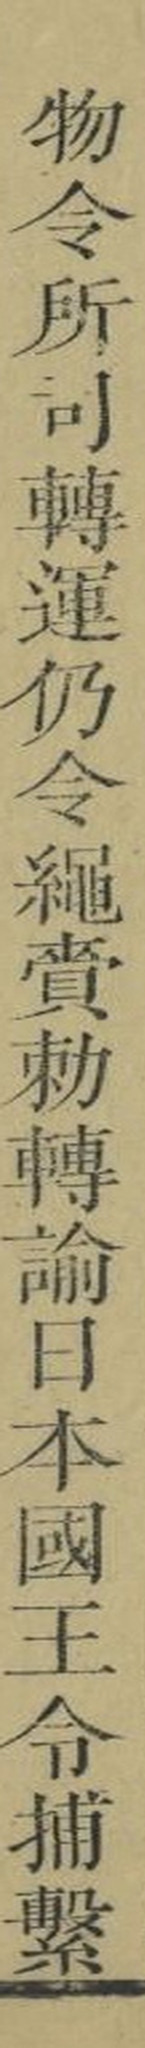物令所司転運仍令縄賚勅転諭日本国王令捕繋
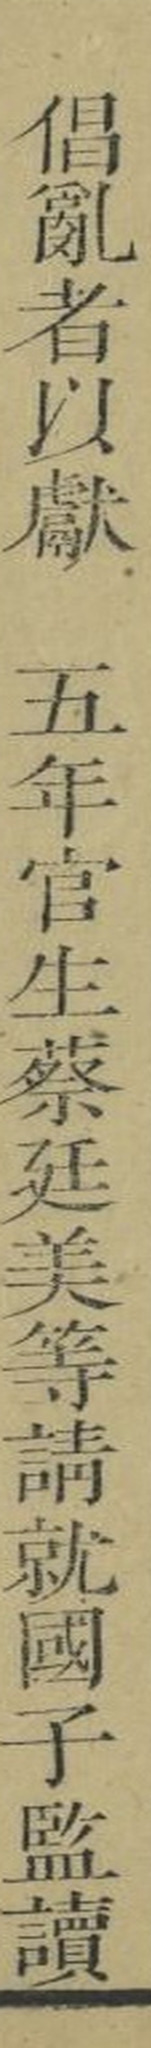倡乱者以献五年官生蔡廷美等請就国子監読
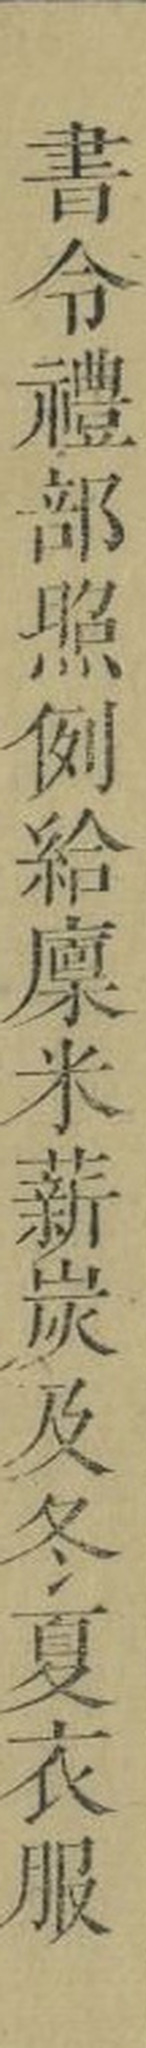書令礼部照例給廩米薪炭及冬夏衣服
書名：中山伝信録 巻三
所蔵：University of the Ryukyus Library
